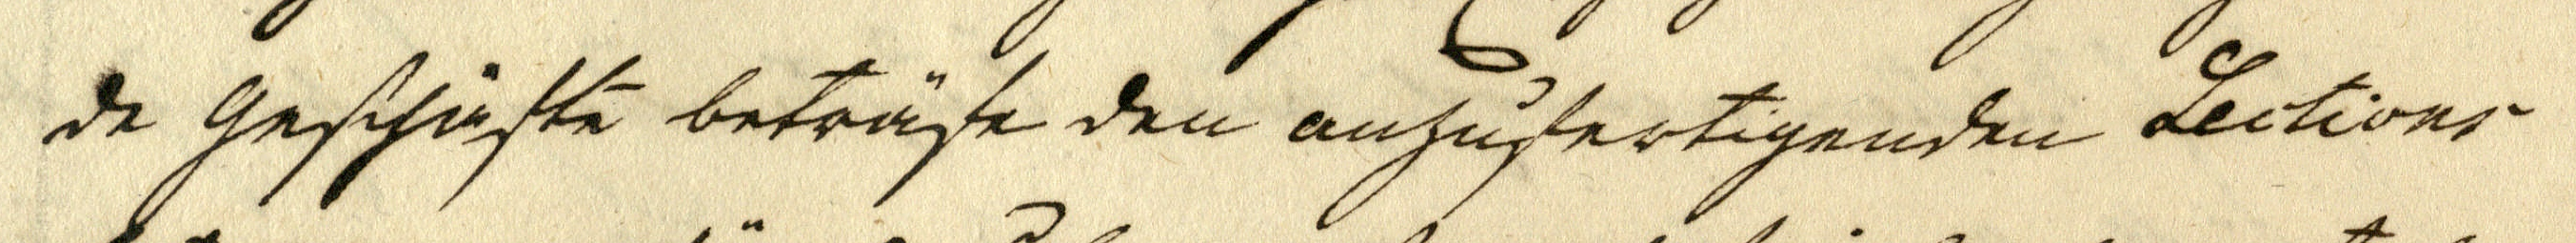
de Geschäfte beträfe den anzufertigenden Lections
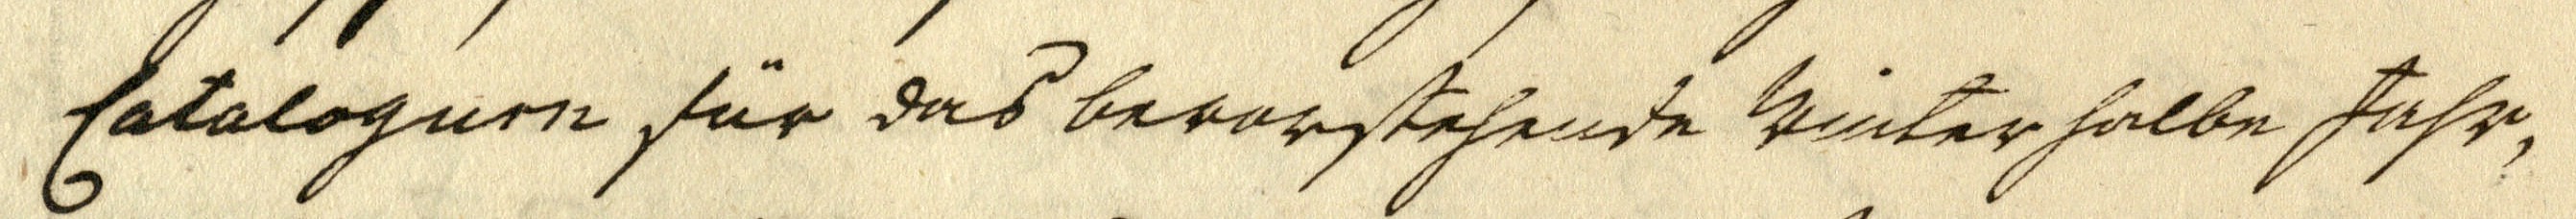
Catalogum für das bevorstehende Winter halbe Jahr,
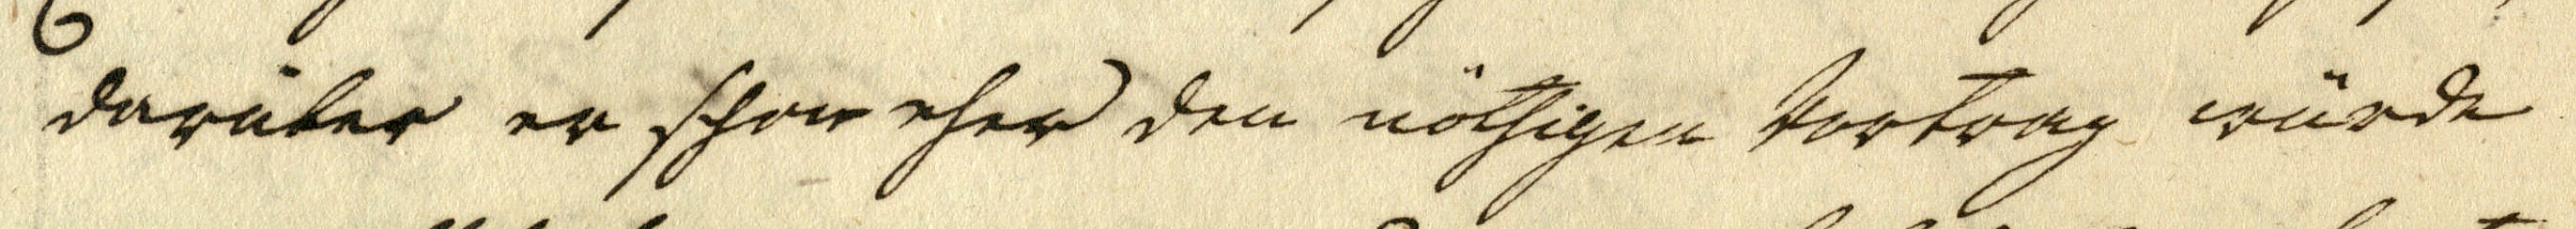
darüber er schon eher den nöthigen Vortrag würde
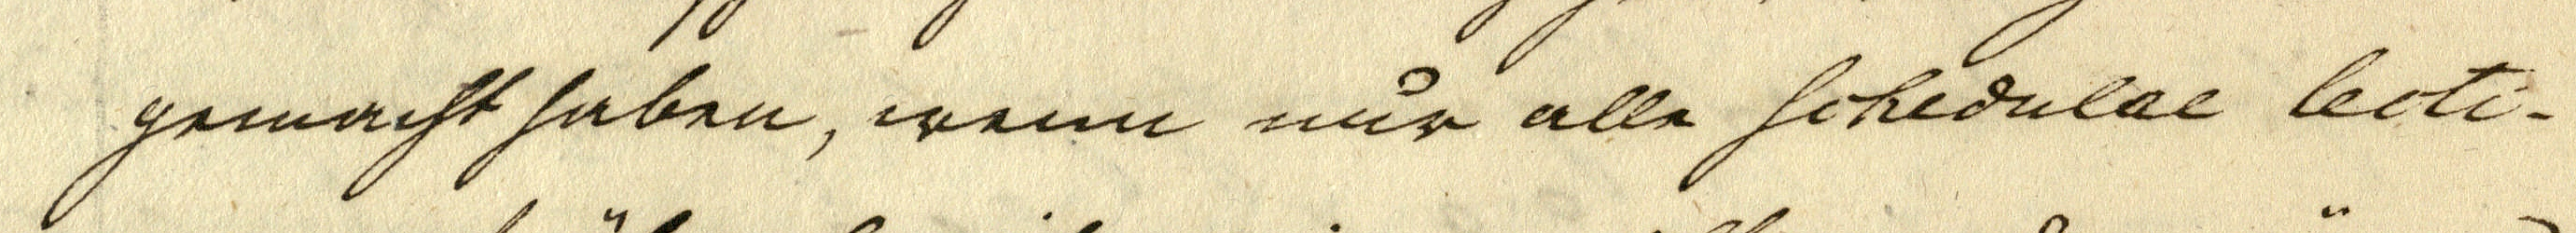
gemacht haben, wenn nur alle schedulae lecti-
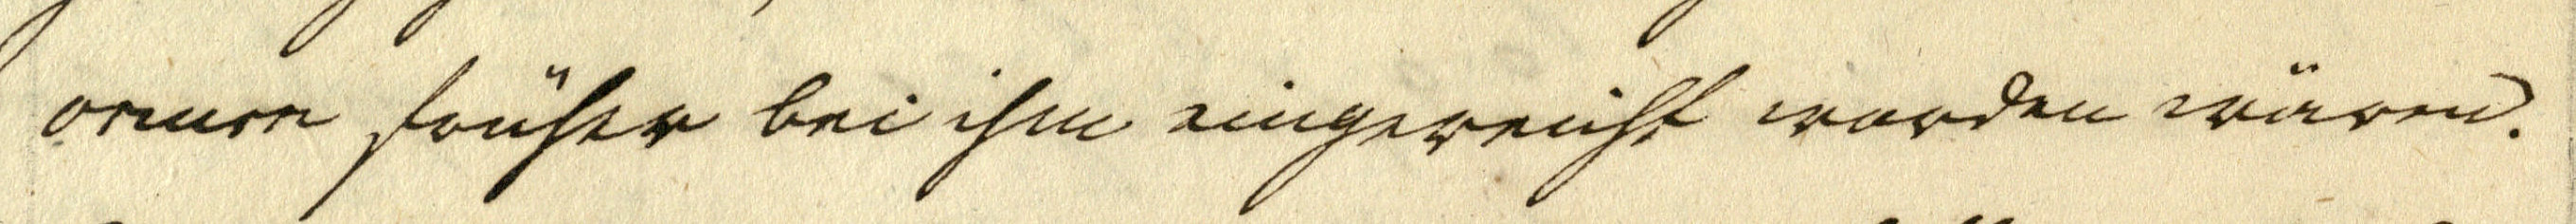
onum früher bei ihm eingereicht worden wären.
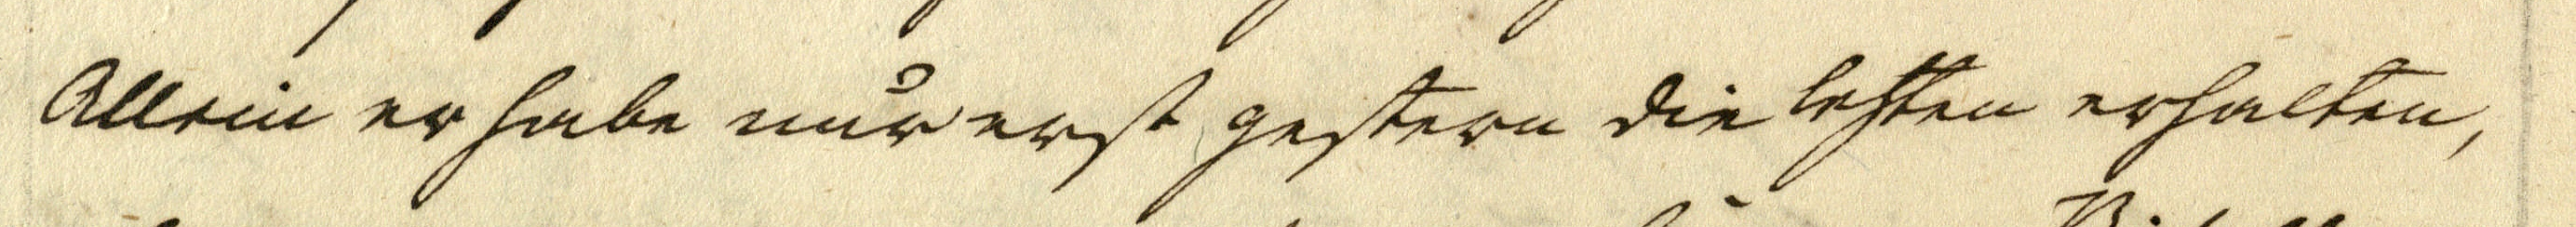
Allein er habe nur erst gestern die letzten erhalten,
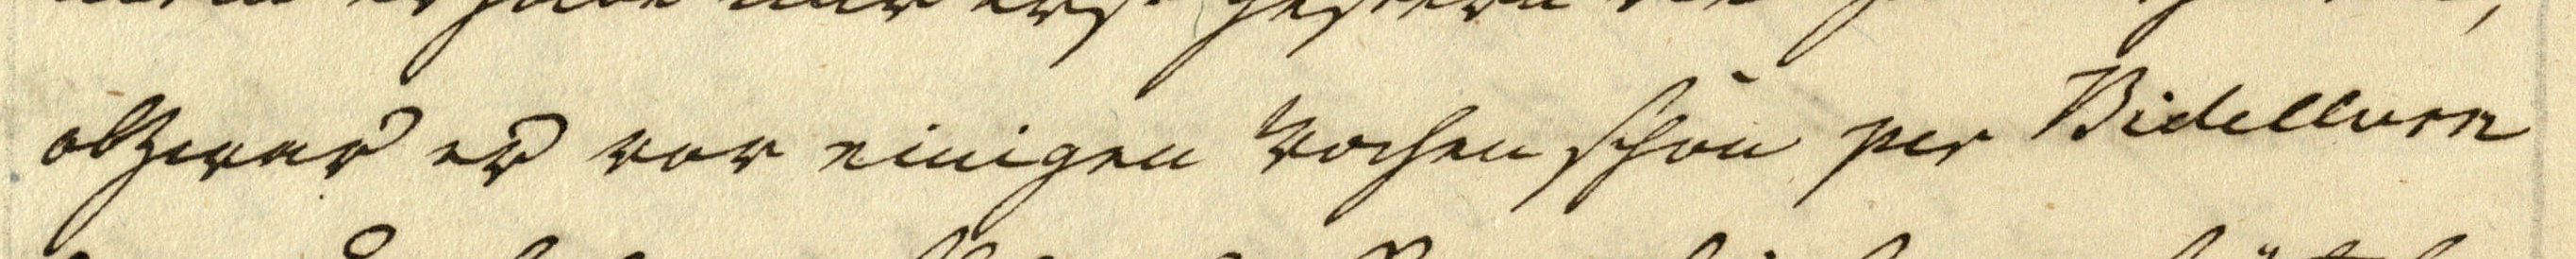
obzwar er vor einigen Wochen schon per Bidellum
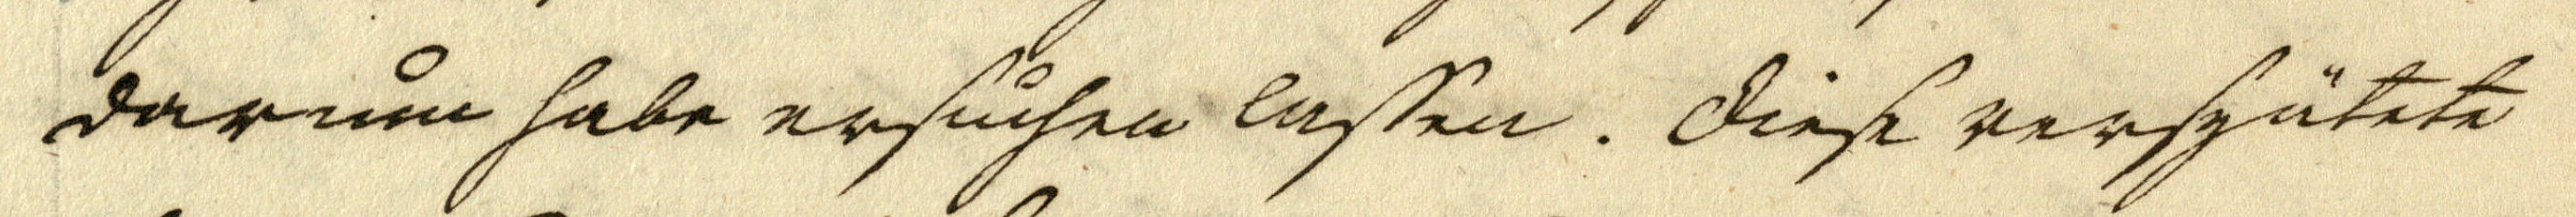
darum habe ersuchen lassen. Diese verspätete
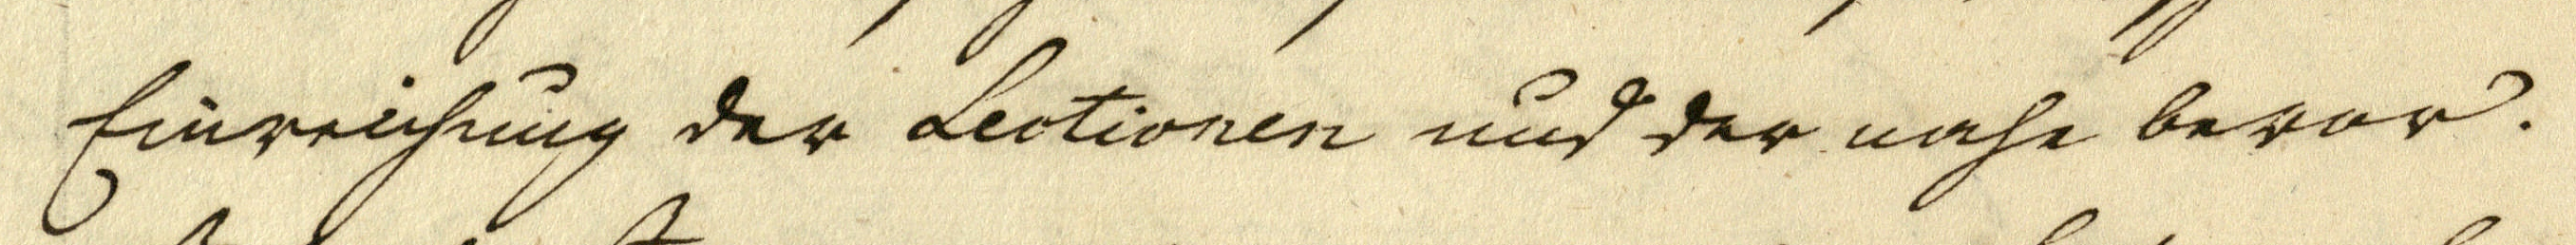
Einreichung der Lectionen und der nahe bevor-
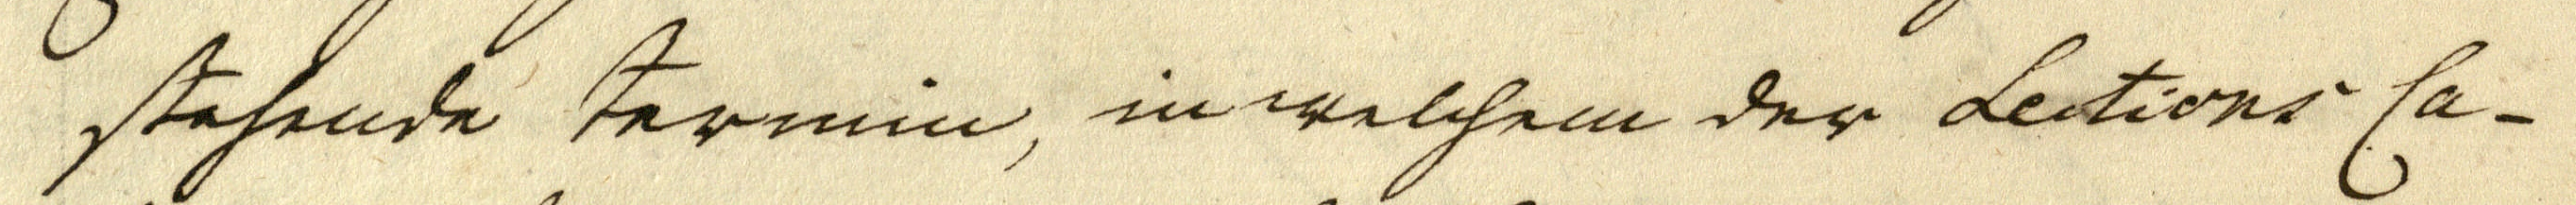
stehende Termin, in welchem der Lections Ca-
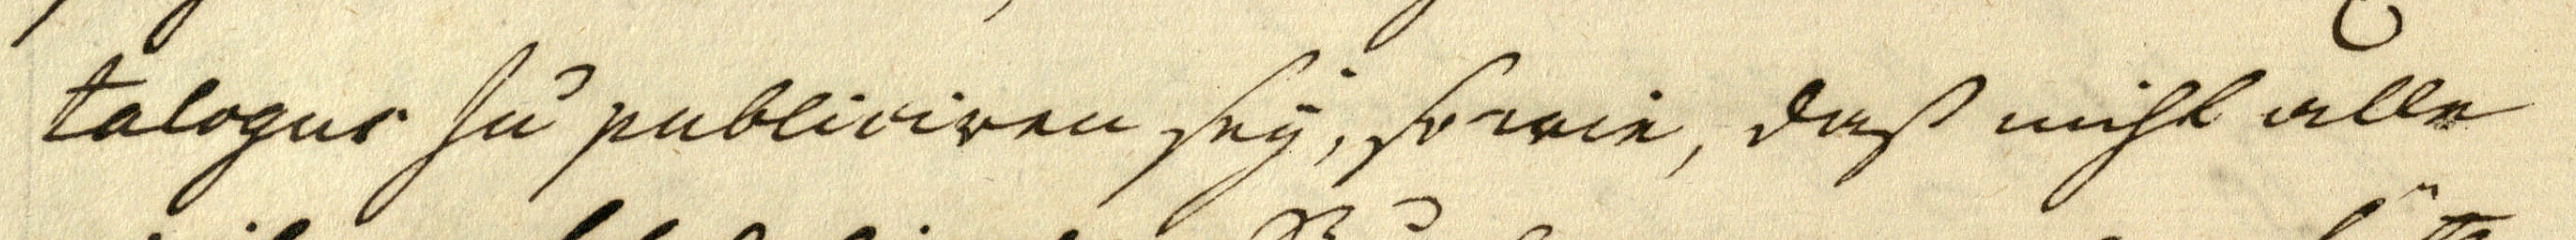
talogus zu publiciren sey, sowie, daß nicht alle
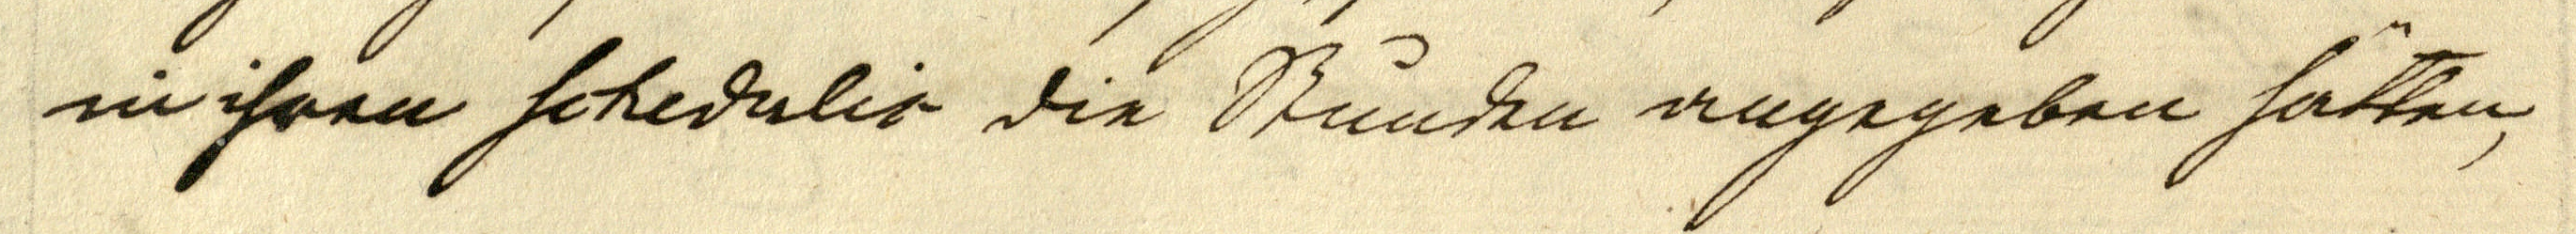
in ihren schedulis die Stunden angegeben hätten,
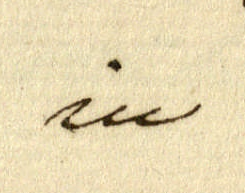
in
